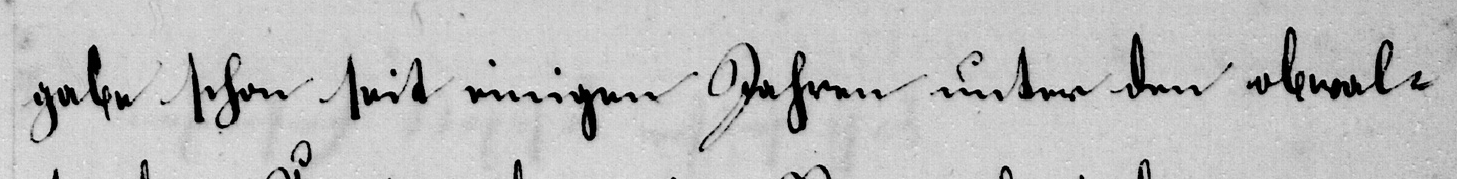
gabe schon seit einigen Jahren unter den obwal¬
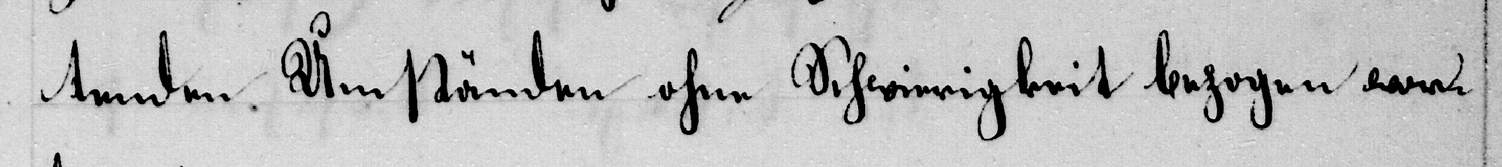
tenden Umständen ohne Schwierigkeit bezogen wor¬
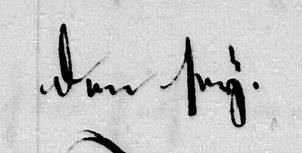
den sey.
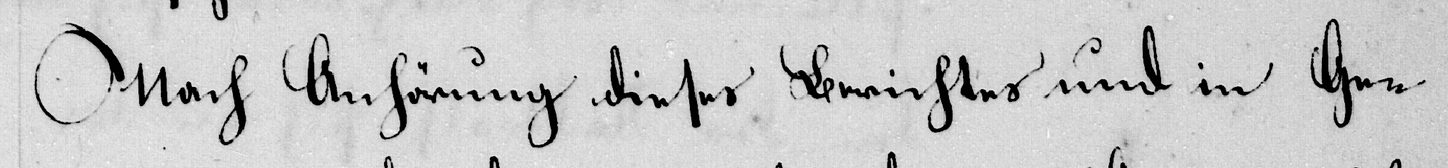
Nach Anhörung dieses Berichtes und in Ge¬
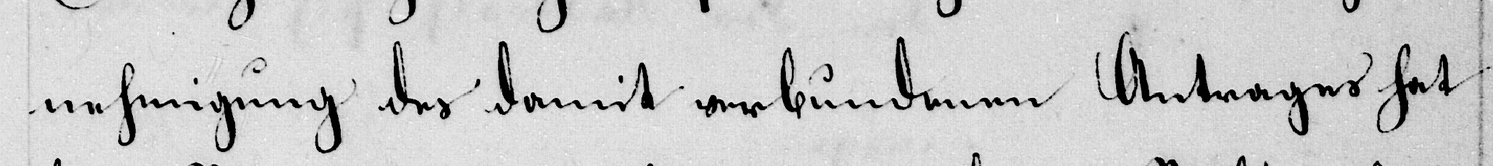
nehmigung des damit verbundenen Antrages hat
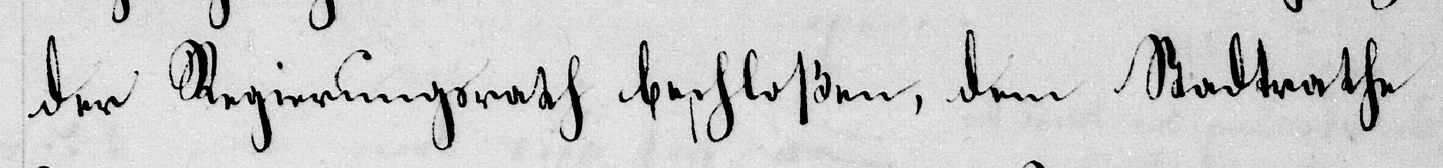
der Regierungsrath beschloßen, dem Stadtrathe
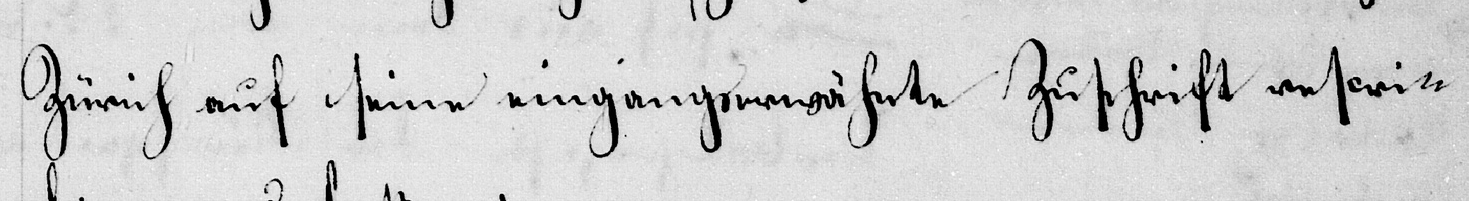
Zürich auf seine eingangserwähnte Zuschrift rescri¬
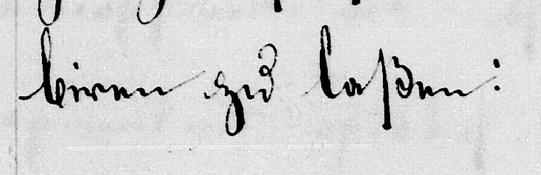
biren zu laßen:
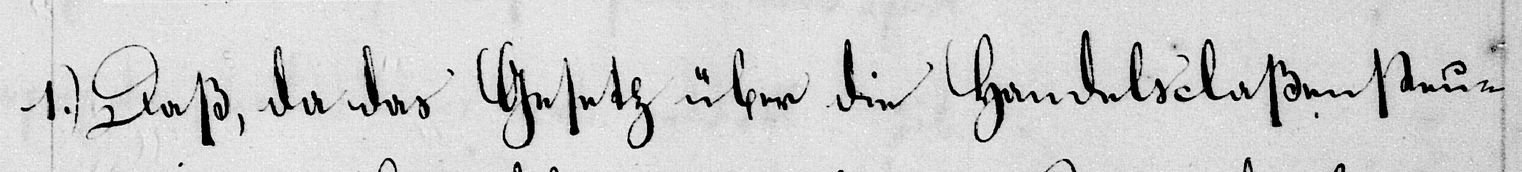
1.) Daß, da das Gesetz über die Handelsclaßensteu¬
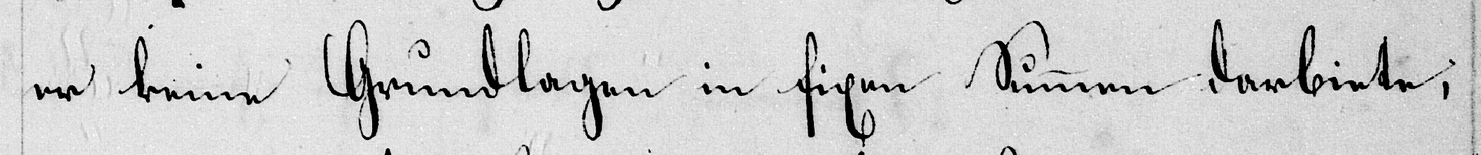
er keine Grundlage in fixen Summen darbiete,
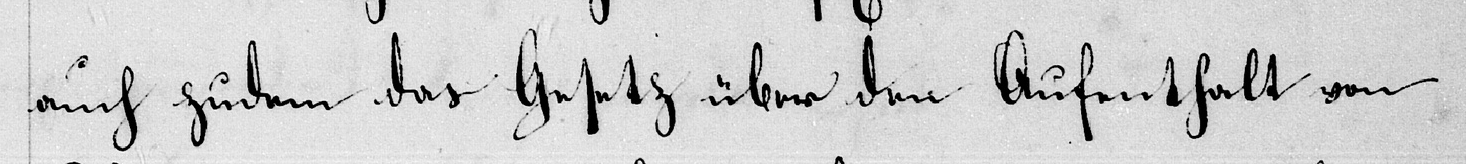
auch zudem das Gesetz über den Aufenthalt von
